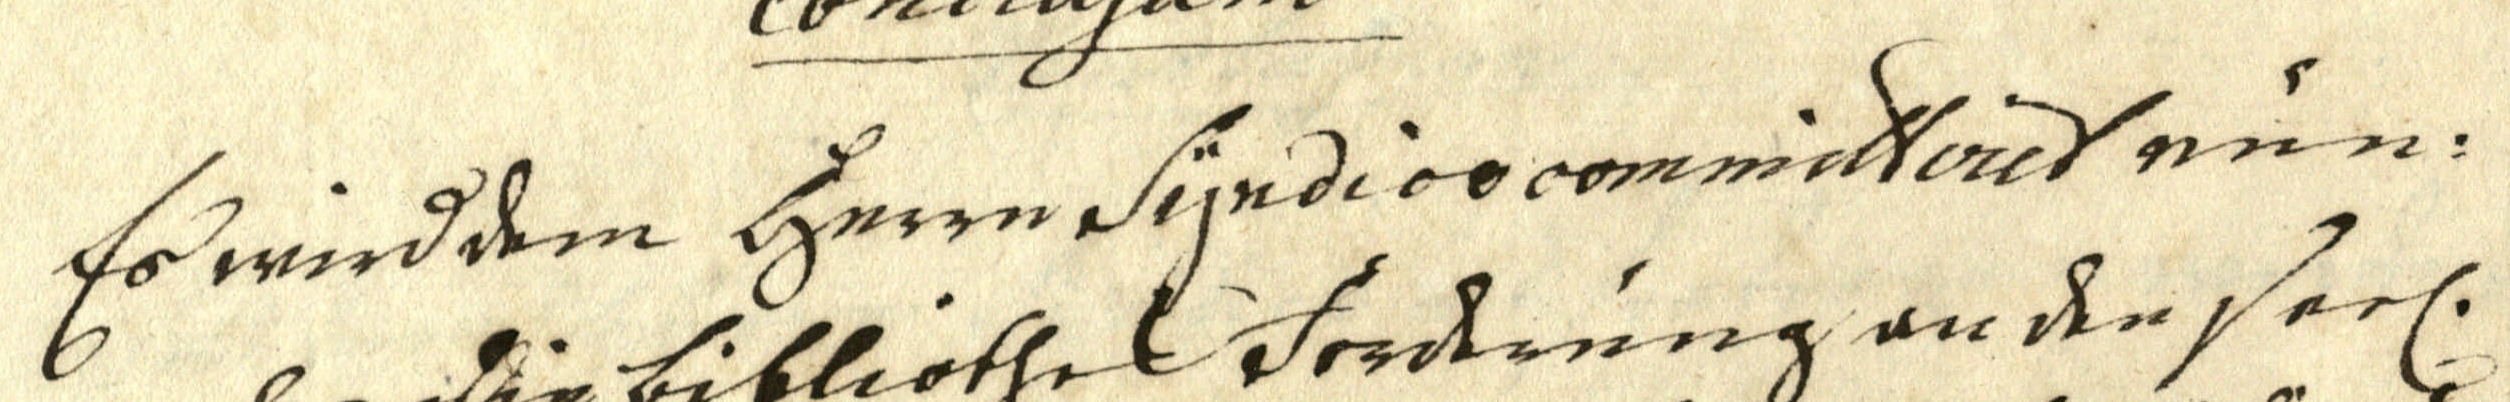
Er wird dem Herrn Sÿndico committiret nun¬
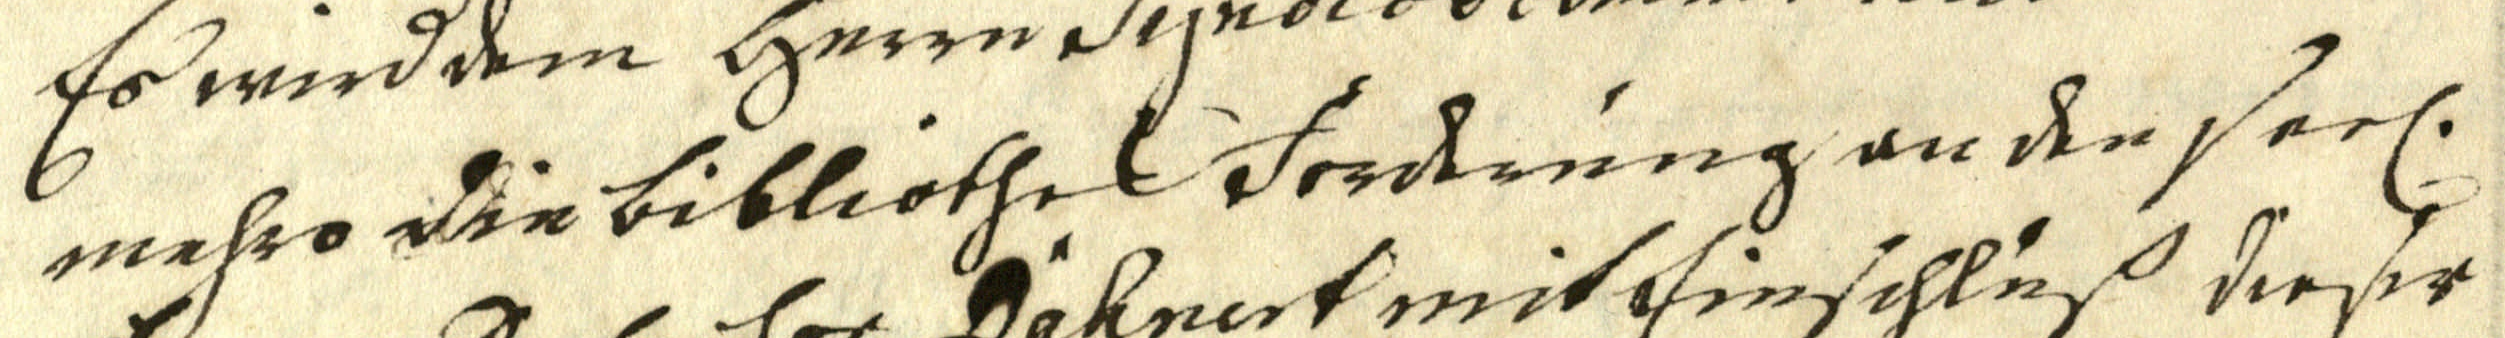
mehro die Bibliothek Forderung an den seel.
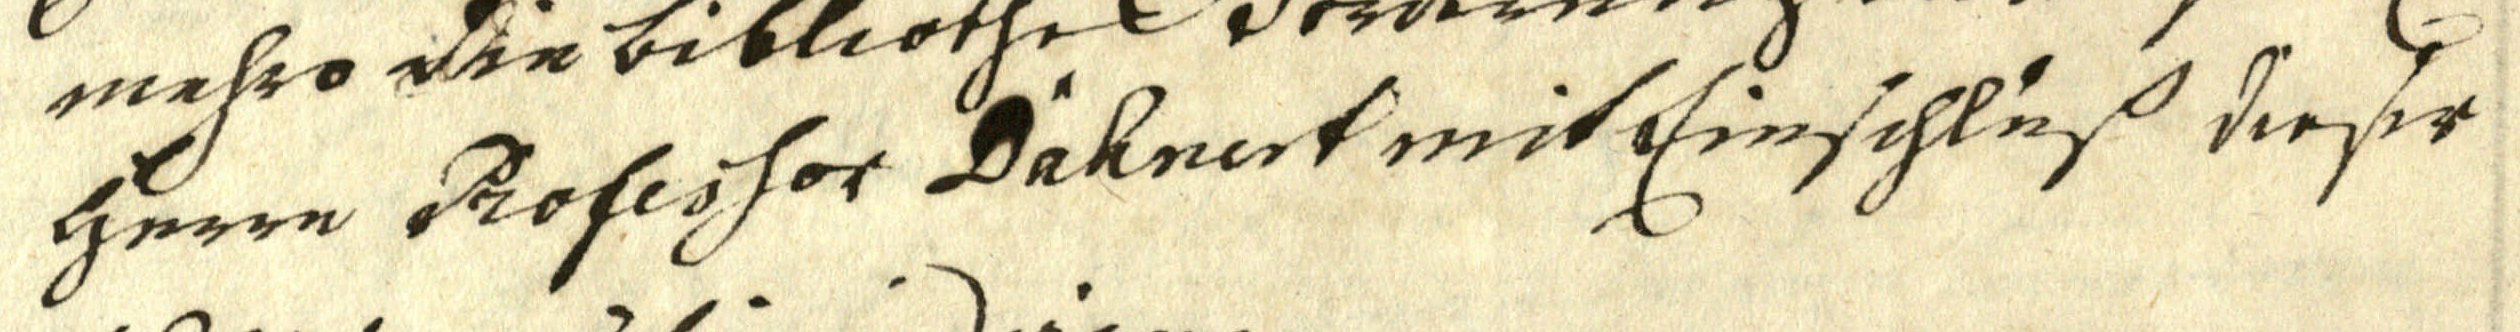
Herrn Professor Dähnert mit Einschluß dieser
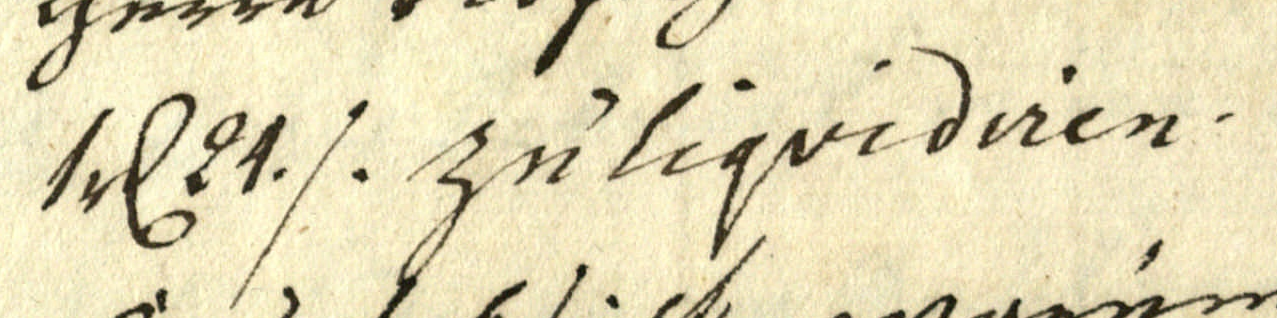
1 rt 24 s. zu liquidiren.
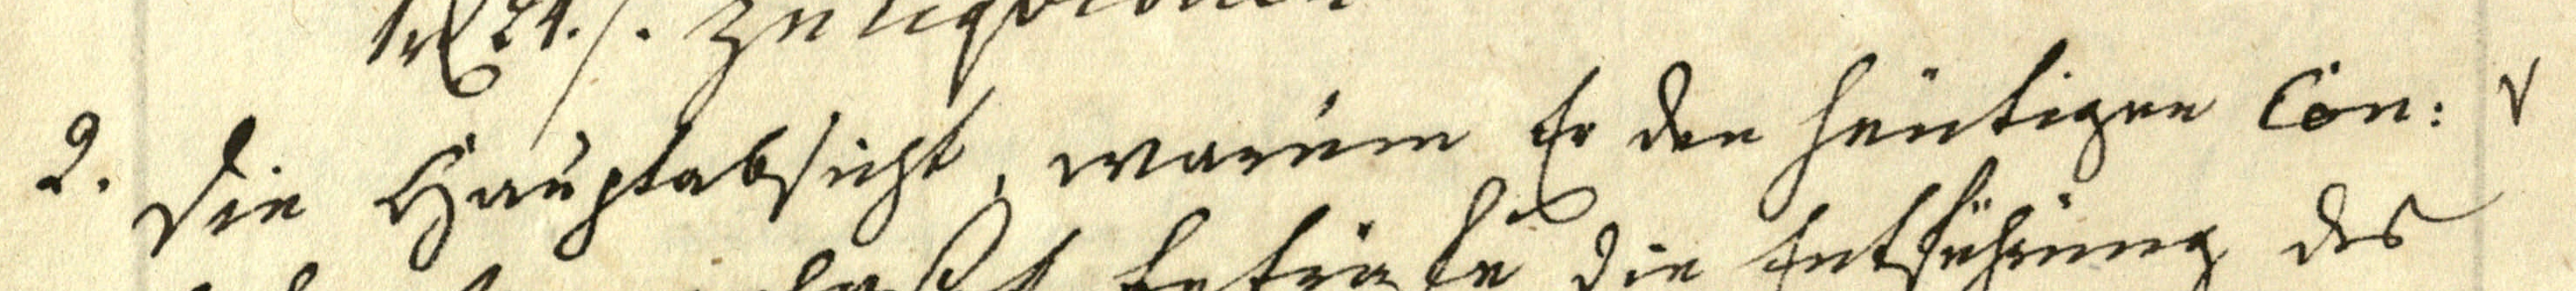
2. die Hauptabsicht, warum Er den heutigen Con¬
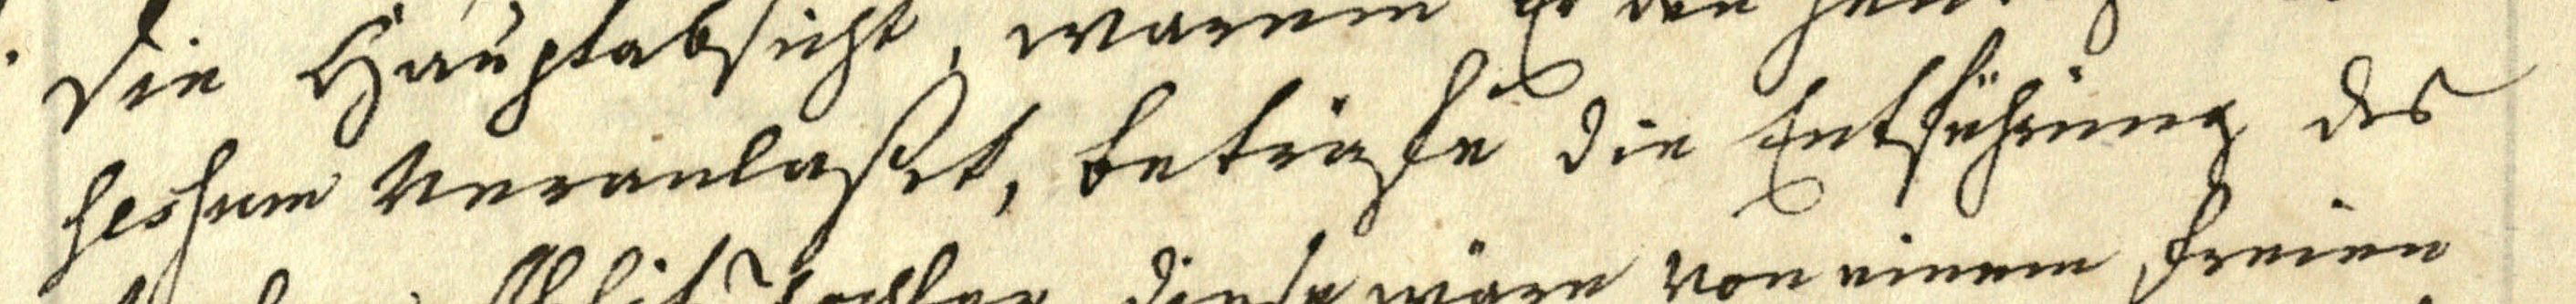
sessum veranlaßet, beträfe die Entführung des
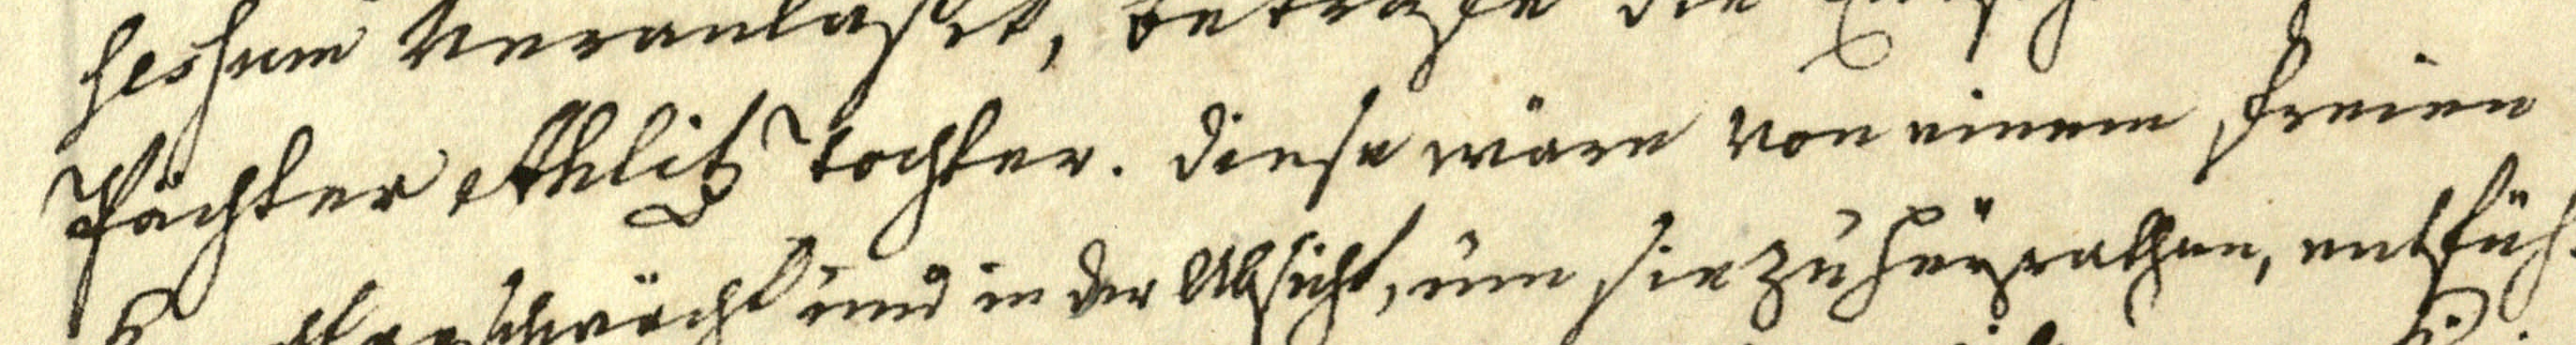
Pächter, Ahlitz Tochter. diese wäre von einem freien
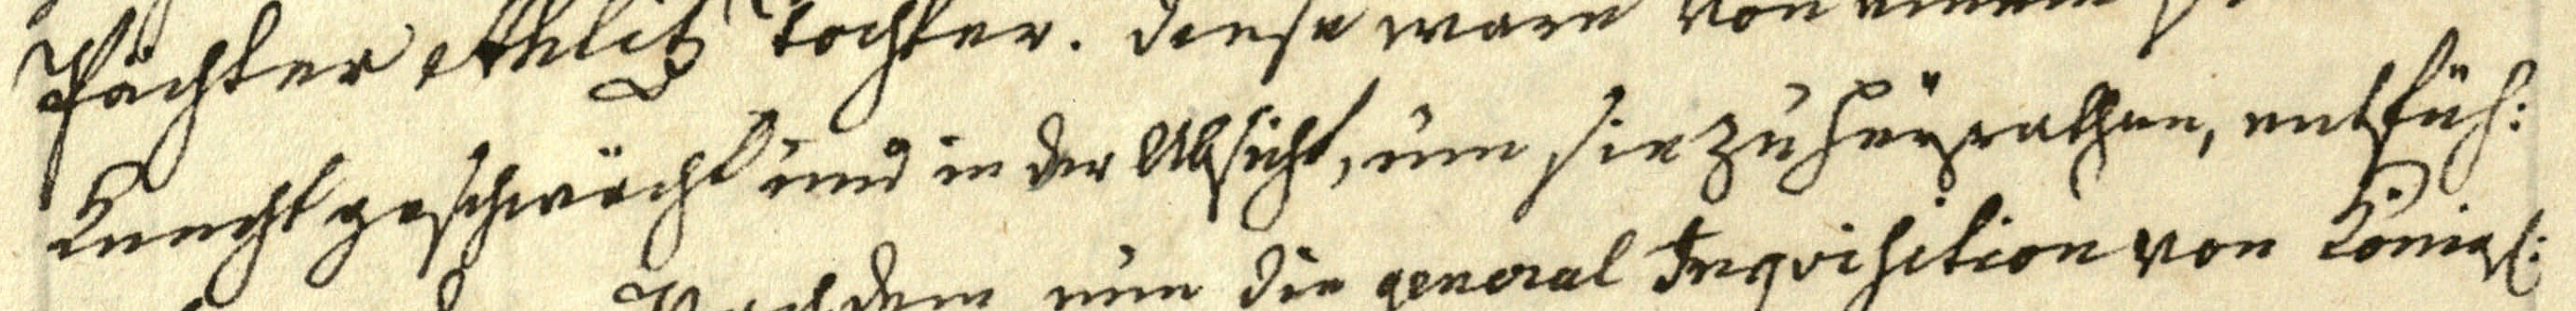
Knecht geschwächt und in der Absicht, um sie zu heÿrathen, entfüh¬
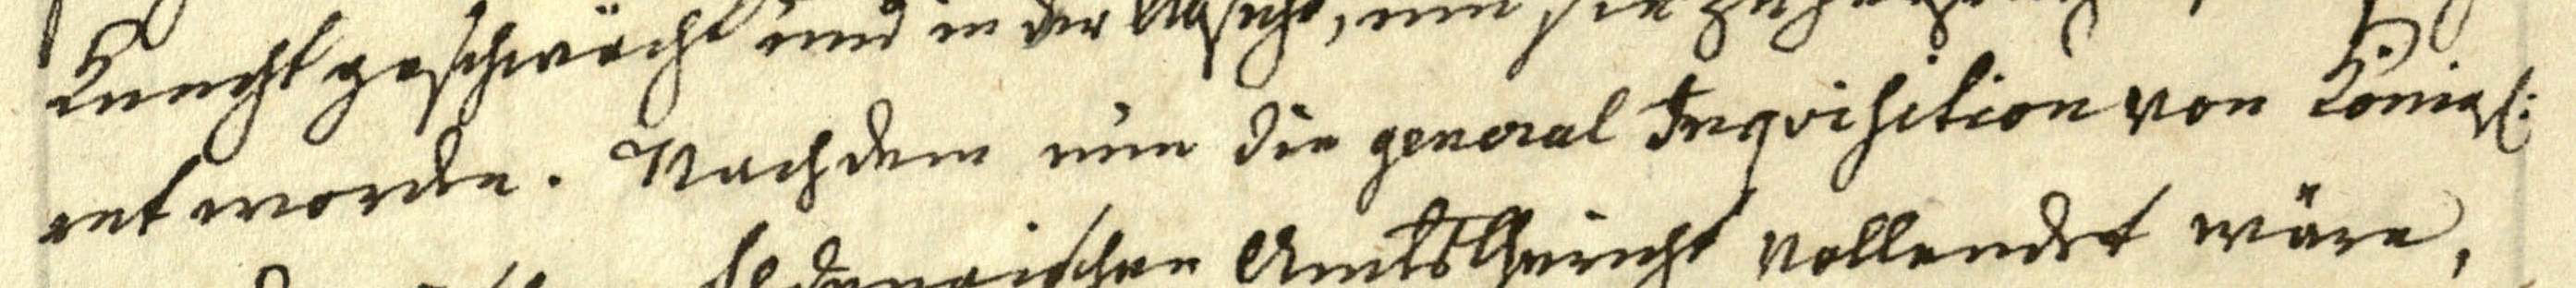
ret worden. Nach dem nun die general Inquisition von Königl.
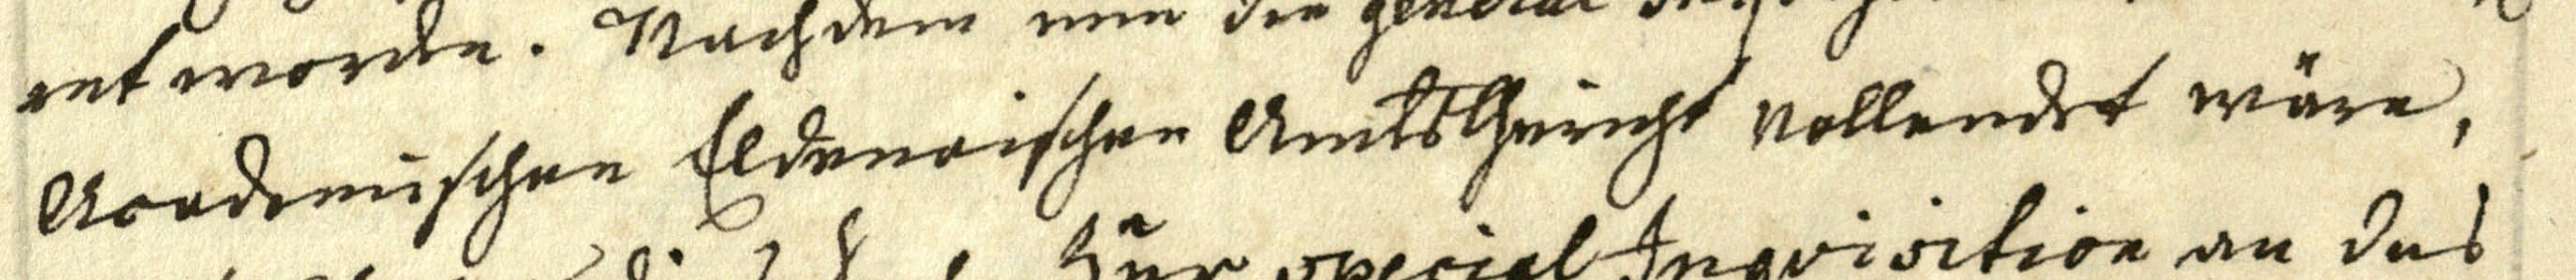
Academischen Eldenaischen Amts Gericht vollendet wäre,
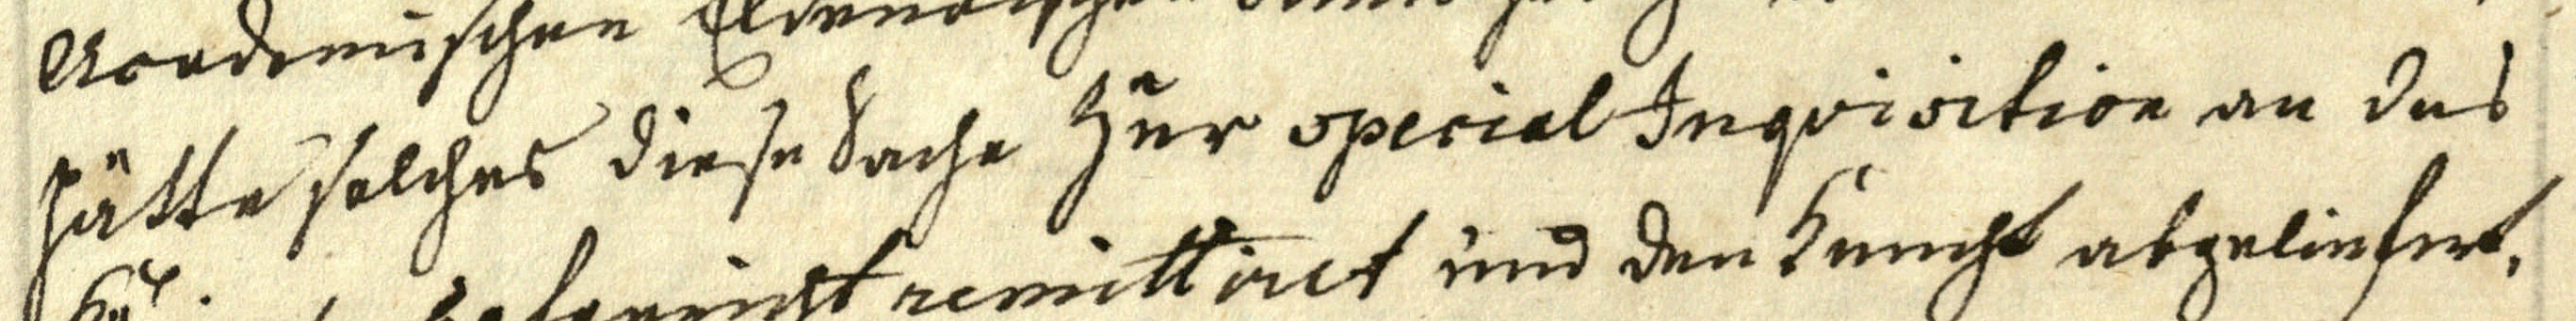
hätte solches diese Sache zur special Inquisition an das
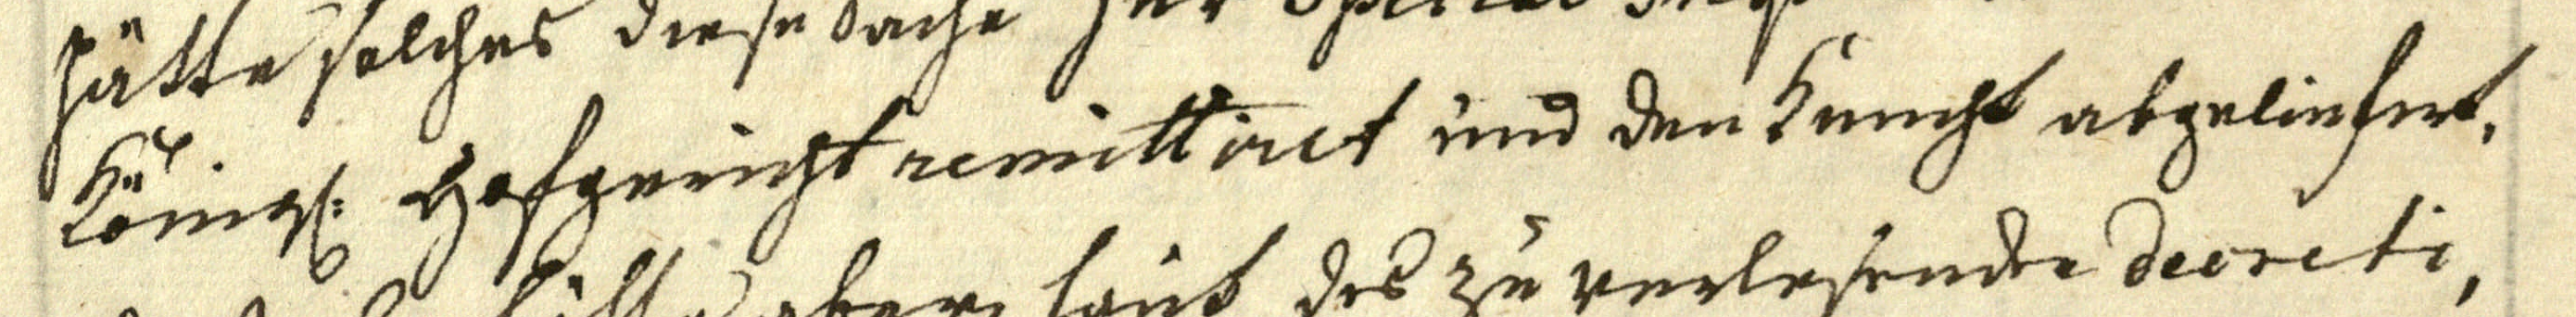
Königl. Hofgericht remittiret und den Knecht abgeliefert,
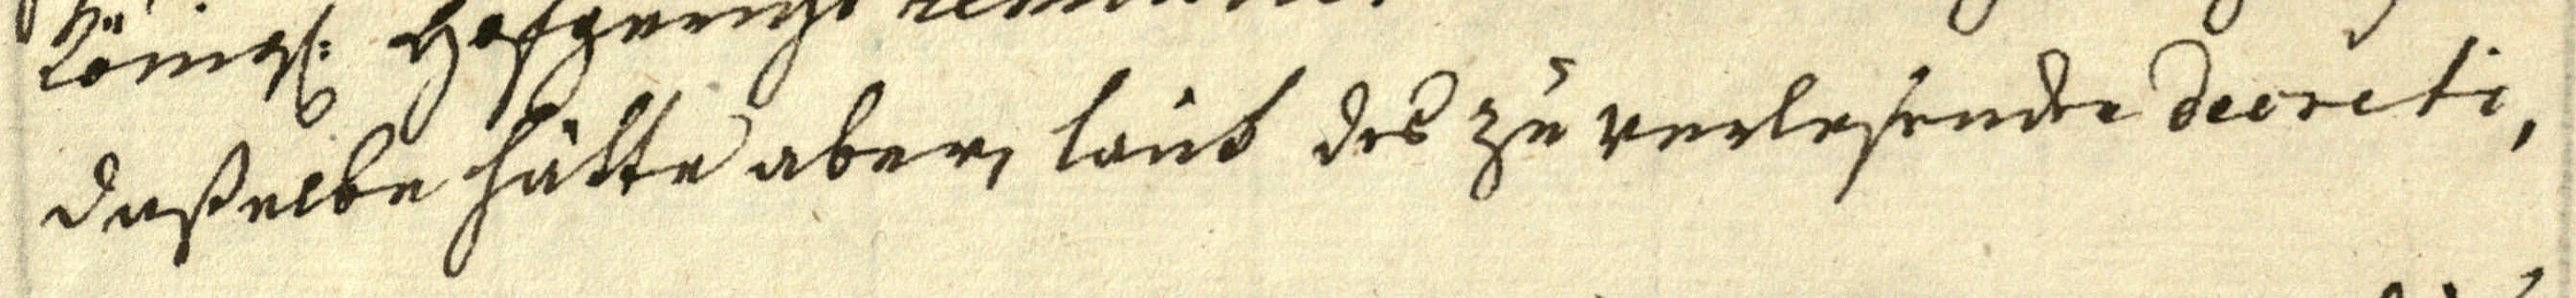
daßelbe hätte aber, laut des zu verlesenden decreti,
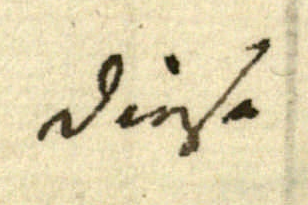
diese
